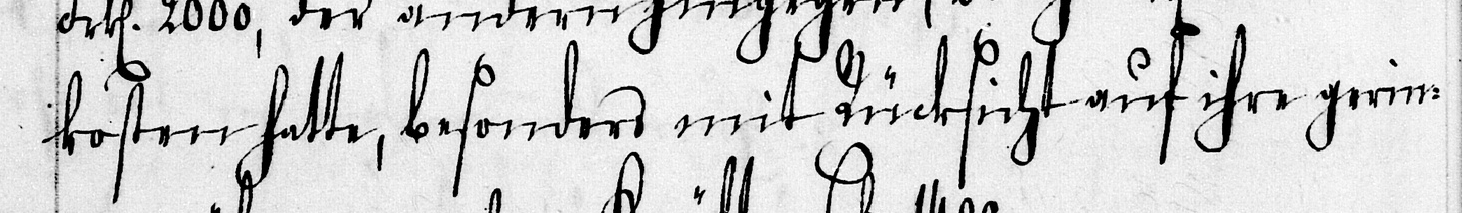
kosten hatte, besonders mit Rücksicht auf ihre geri¬
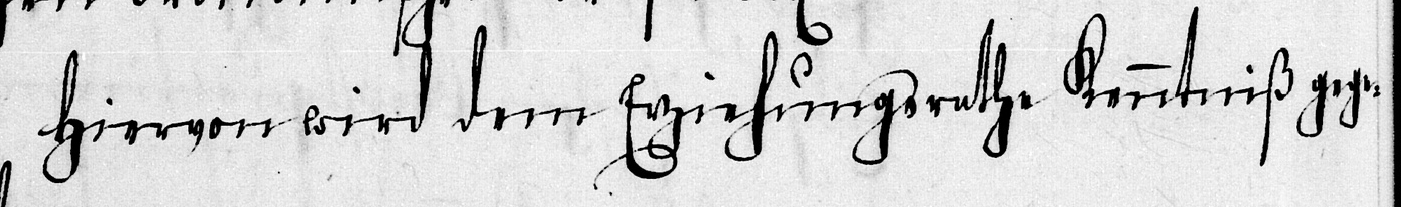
Hiervon wird dem Erziehungsrathe Kenntniß geg¬
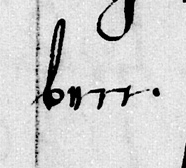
eben.
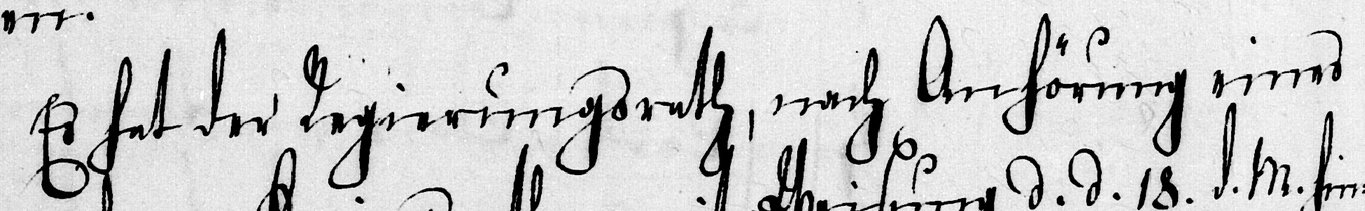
Es hat der Regierungsrath, nach Anhörung eines
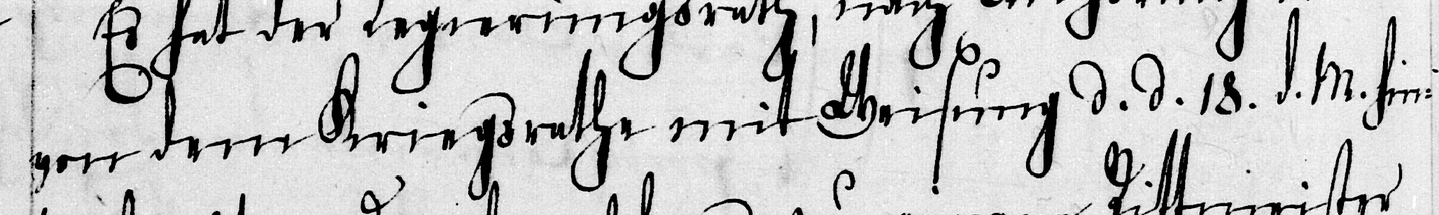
von dem Kriegsrathe mit Weisung d. d. 18. d. M.
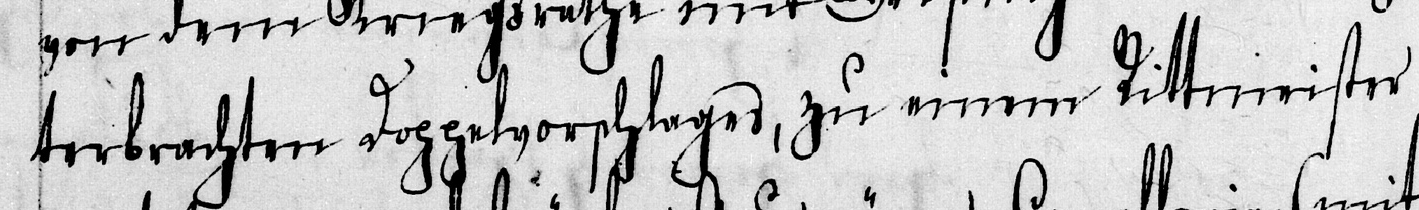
terbrachten Doppelvorschlages, zu einem Rittmeister
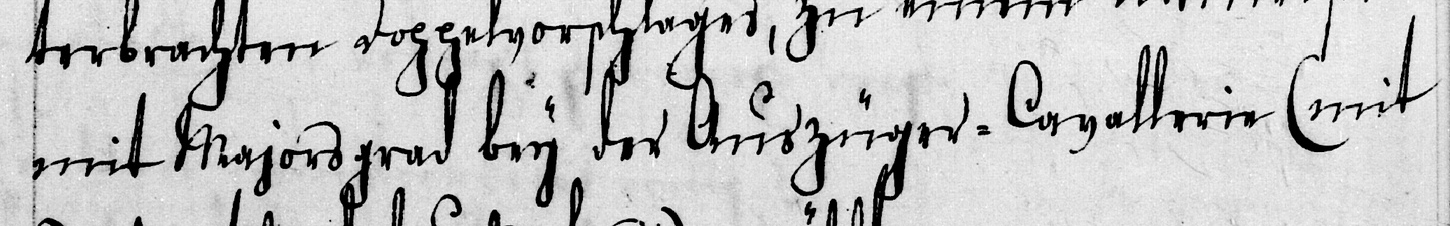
mit Majorsgrad bey der Auszüger-Cavallerie (mit
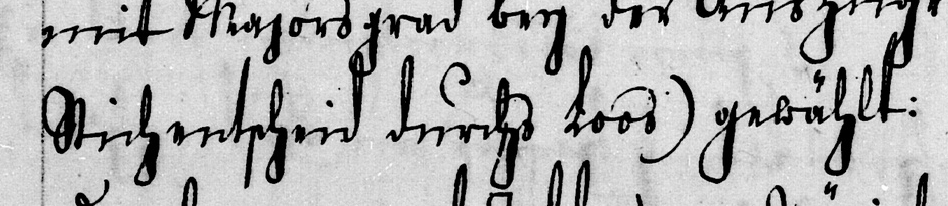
Stichentscheid durch Loos) gewählt:
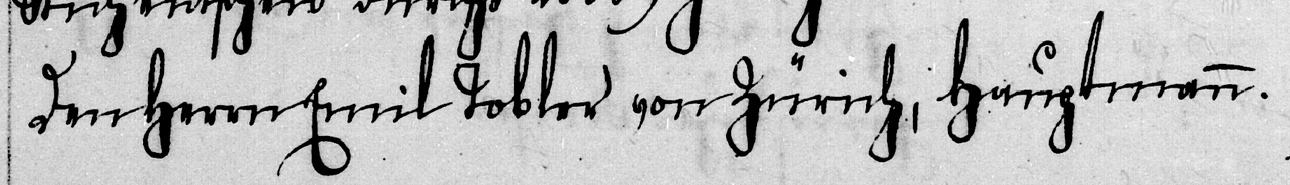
Den Herrn Emil Tobler von Zürich, Hauptmann.
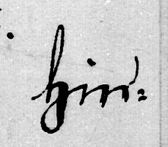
hin¬
